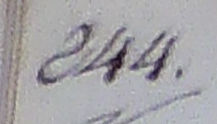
244.
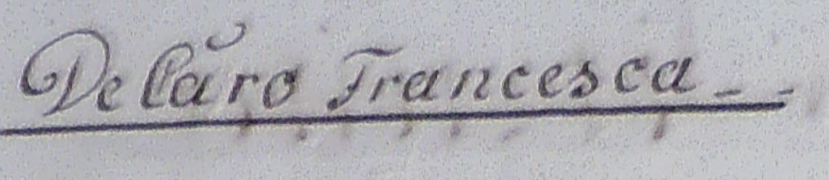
Delaro Francesca .. ..
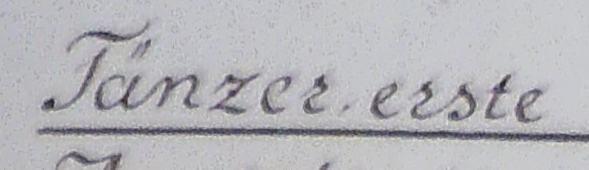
Tänzer, erste
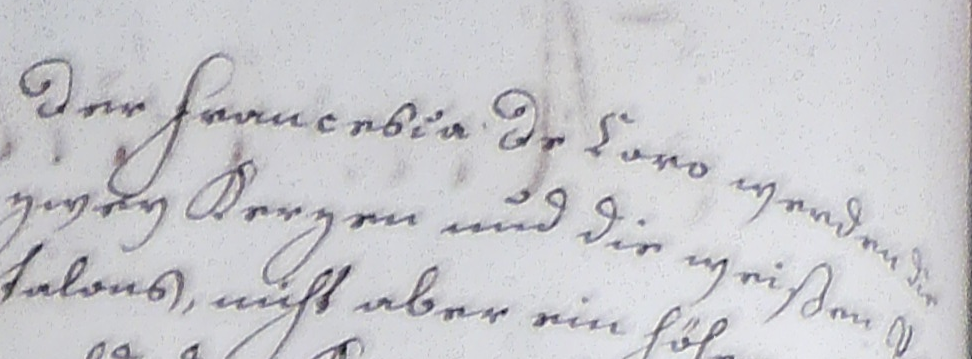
Der Francesca de Laro werden die
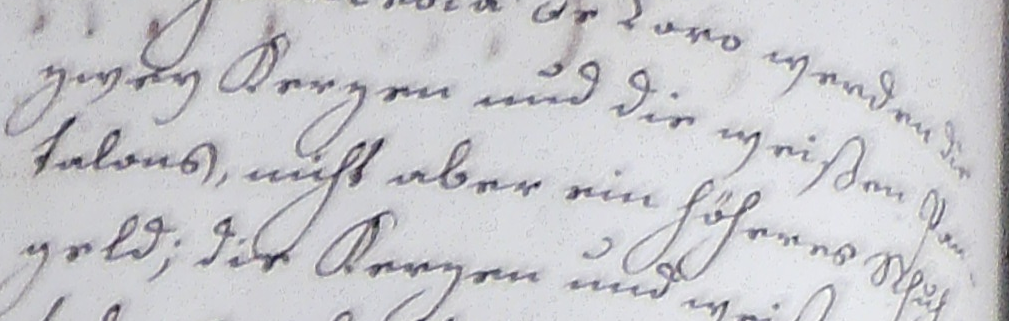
zwey Kerzen und die weißen Pan¬
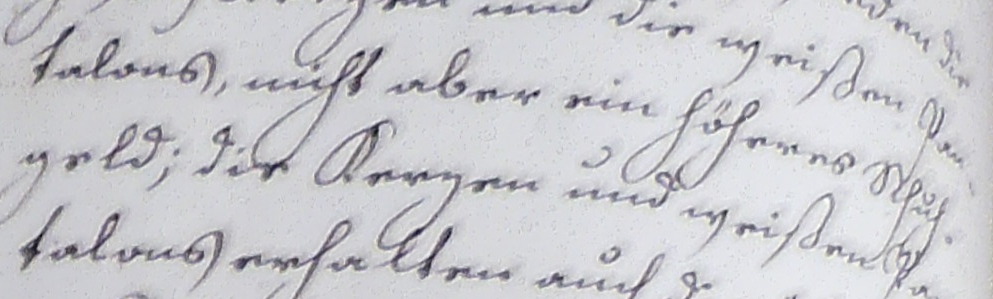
talons, nicht aber ein höheres Schu¬
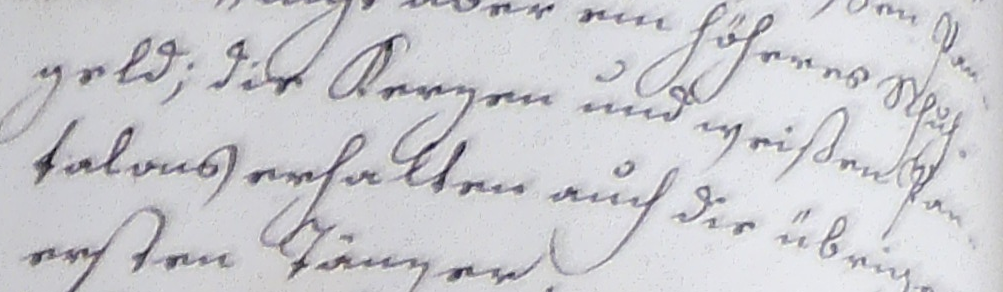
geld, die Kerzen und weißen Pan¬
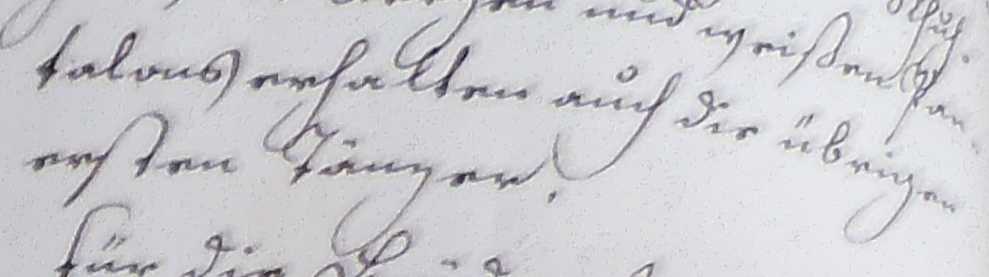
talons erhalten auch die übrigen
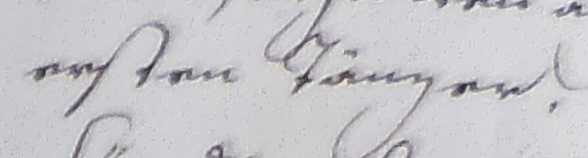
ersten Tänzer.
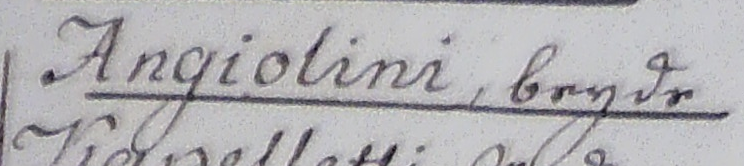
Angiolini, beyde
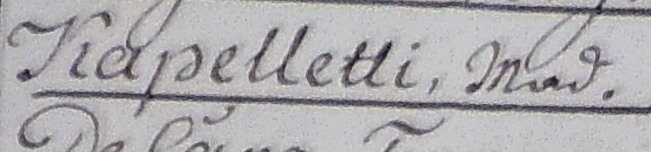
Kapelleti, Mad.
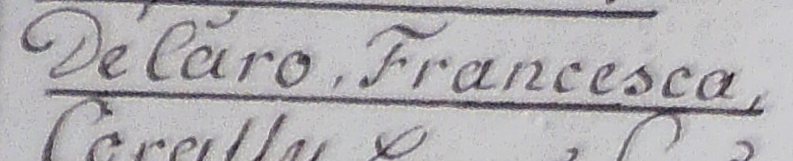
Delaro, Francesca,
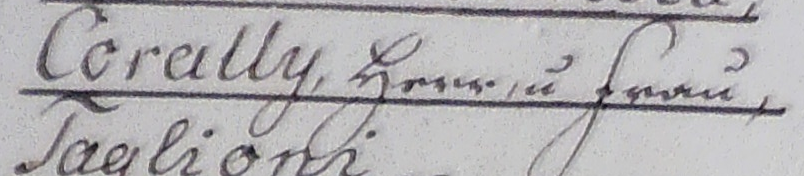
Corally, Herr u Frau,
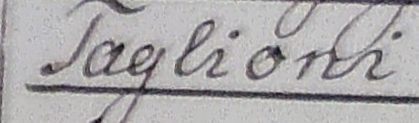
Taglioni
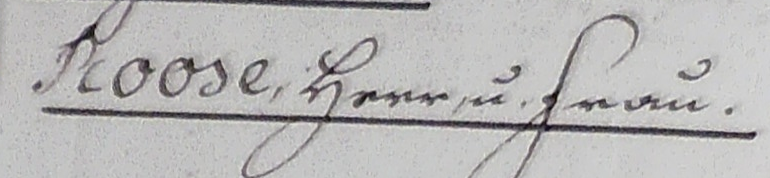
Roose, Herr u Frau.
